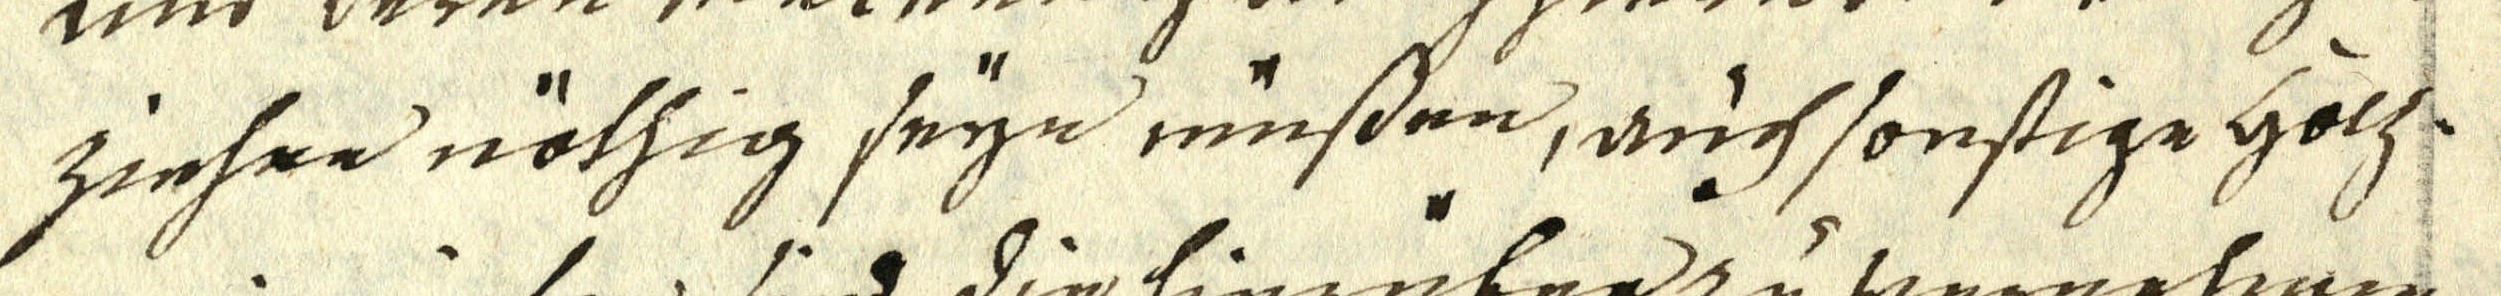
ziehen nöthig seÿn müßen, auch sonstige Holz¬
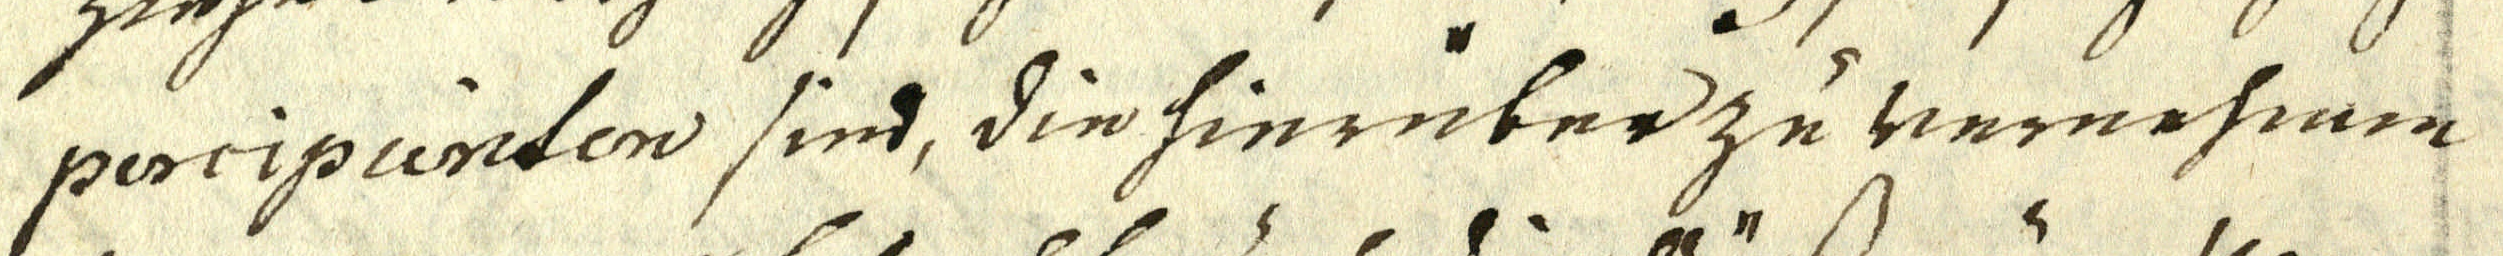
percipienten sind, die hierüber zu vernehmen
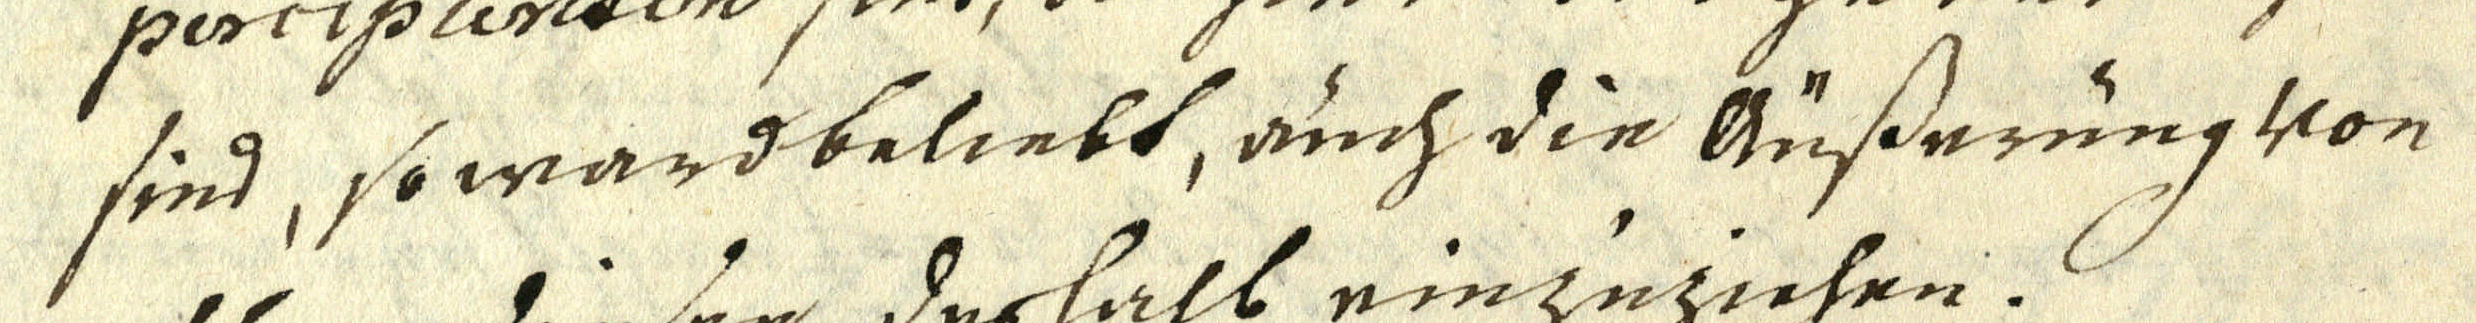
sind, so ward beliebt, auch die Äußerung von
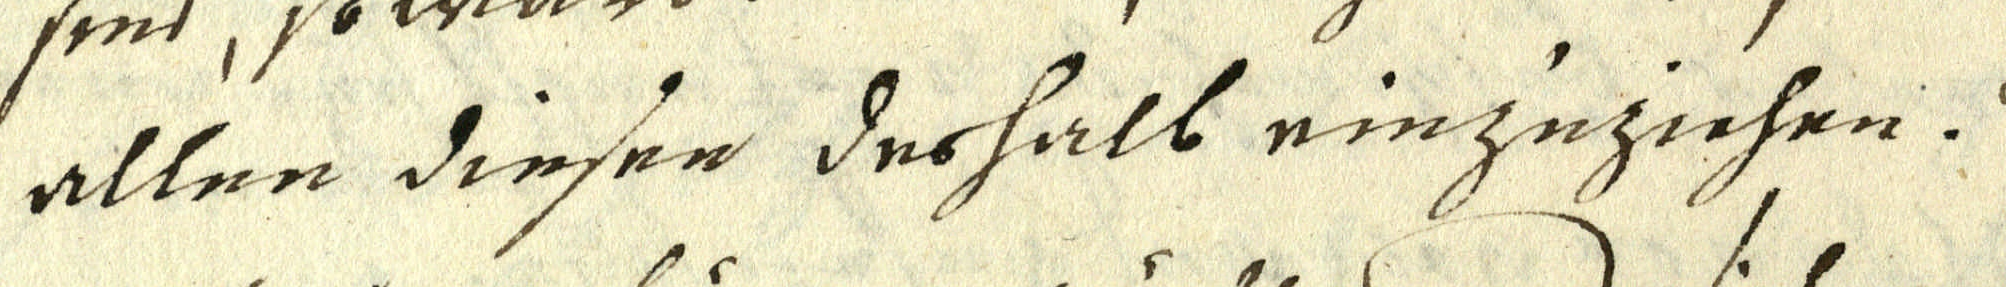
allen diesen deshalb einzuziehen.
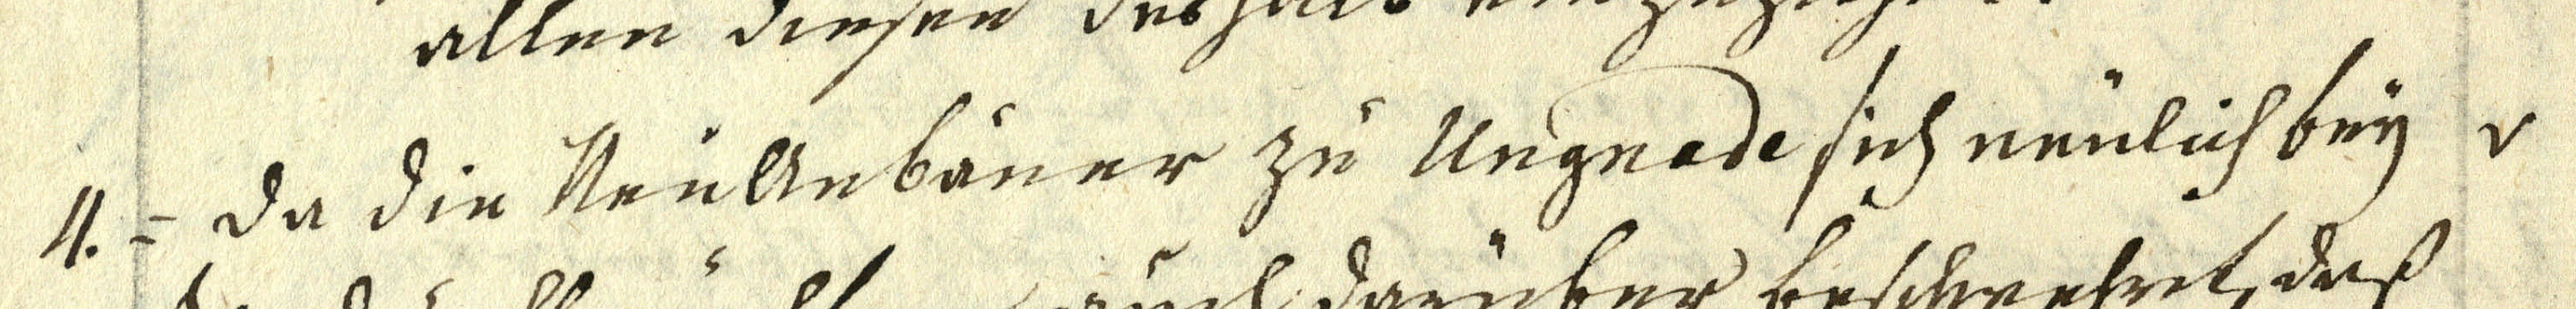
4. Da die NeuAnbauer zu Ungnade sich neulich beÿ
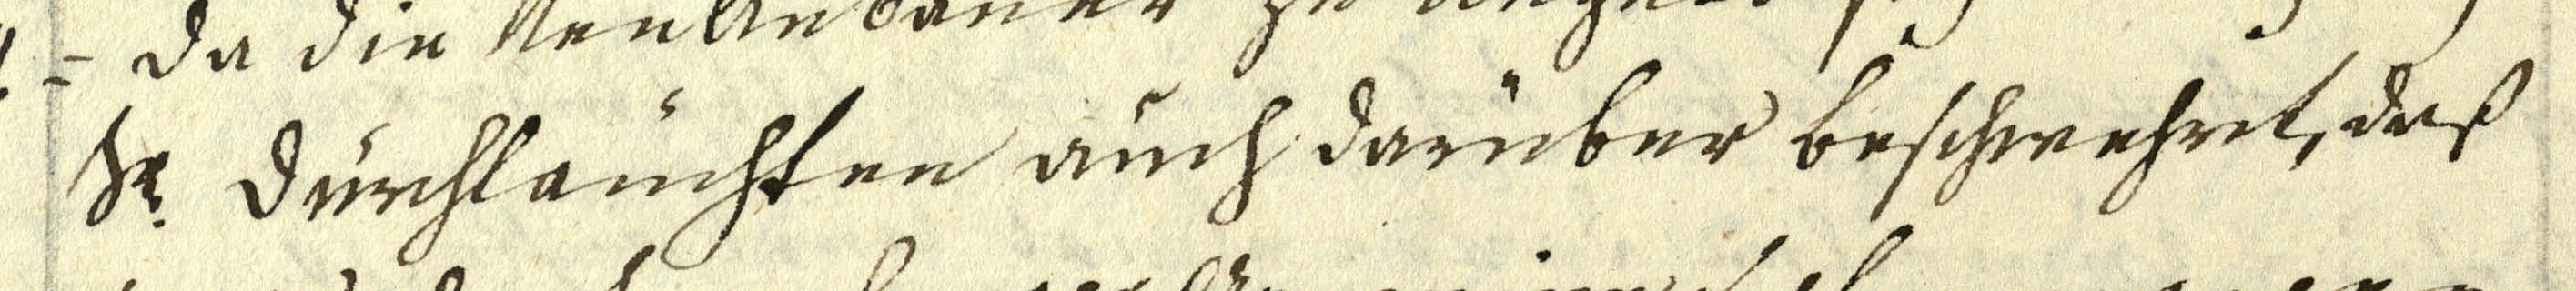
Sr. Durchlauchten auch darüber beschwehret, daß
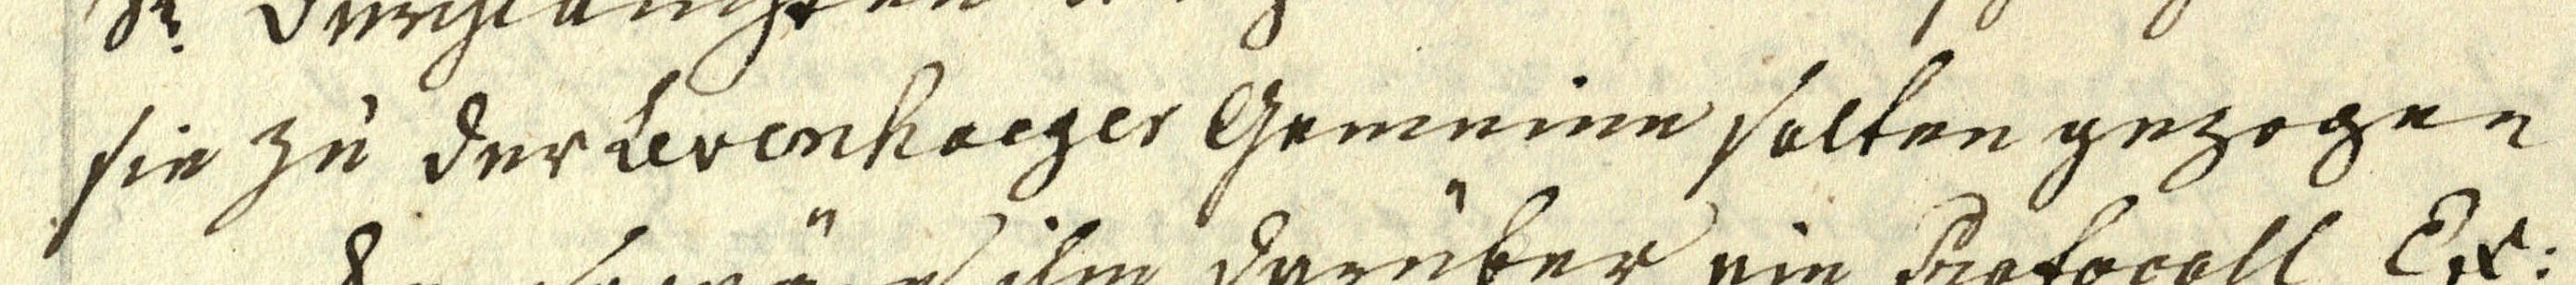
sie zu der Levenhaeger Gemeine solten gezogen
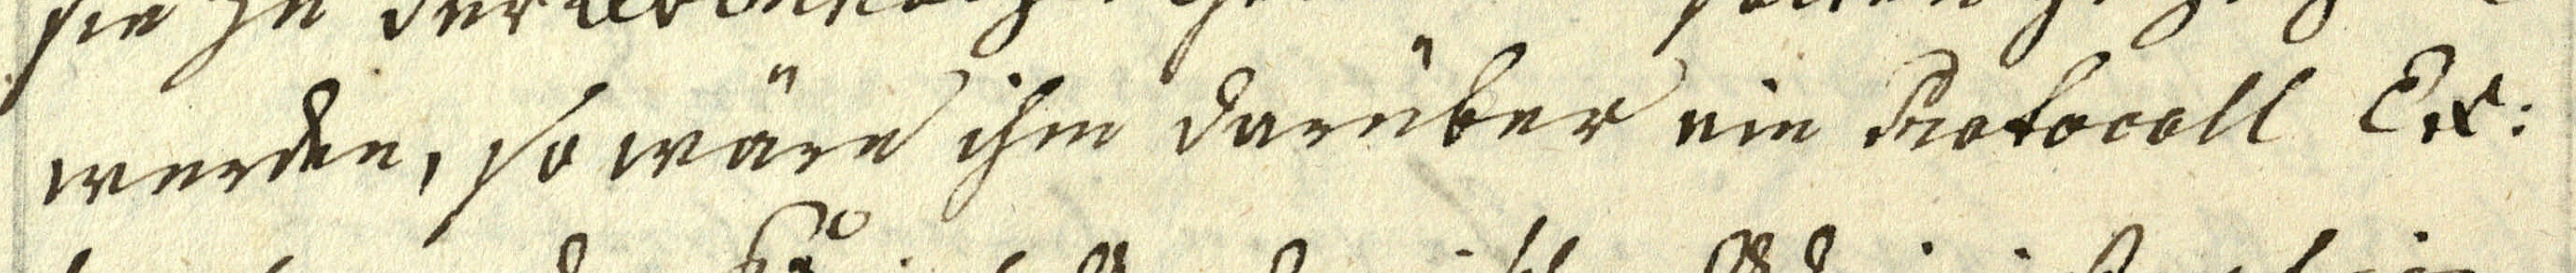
werden, so wäre ihm darüber ein Protocoll Ex¬
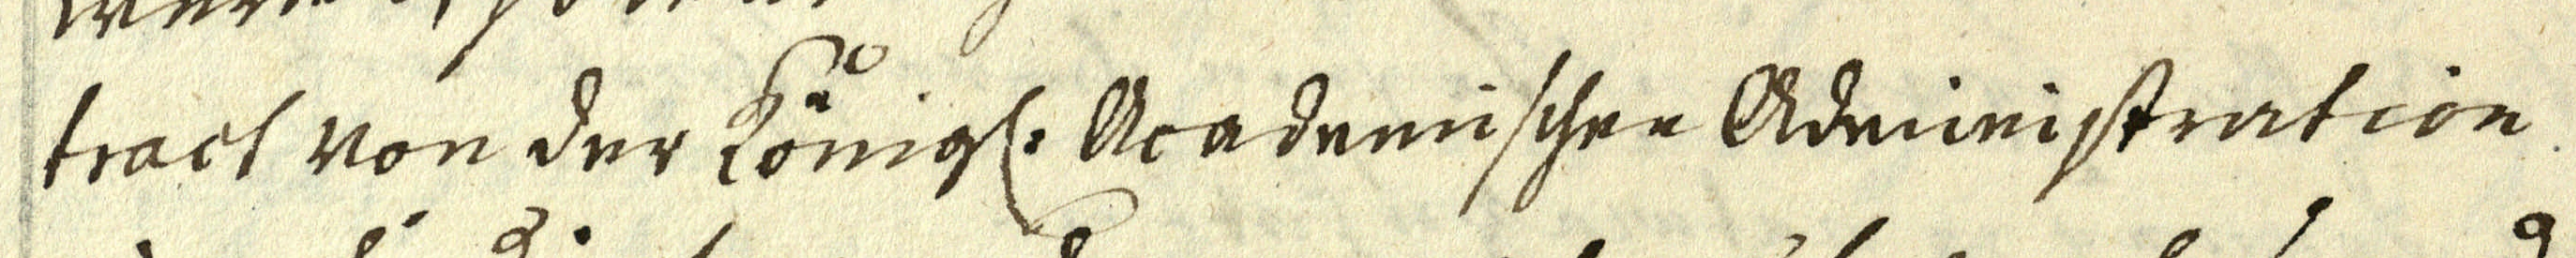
tract von der Königl. Academischen Administration
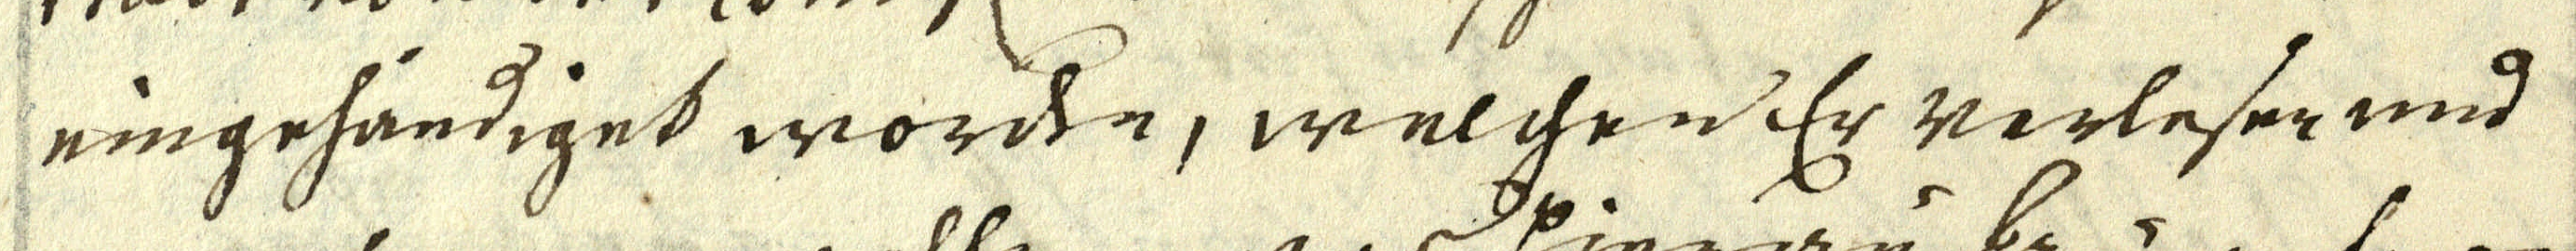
eingehändiget worden, welchen Er verlesen und
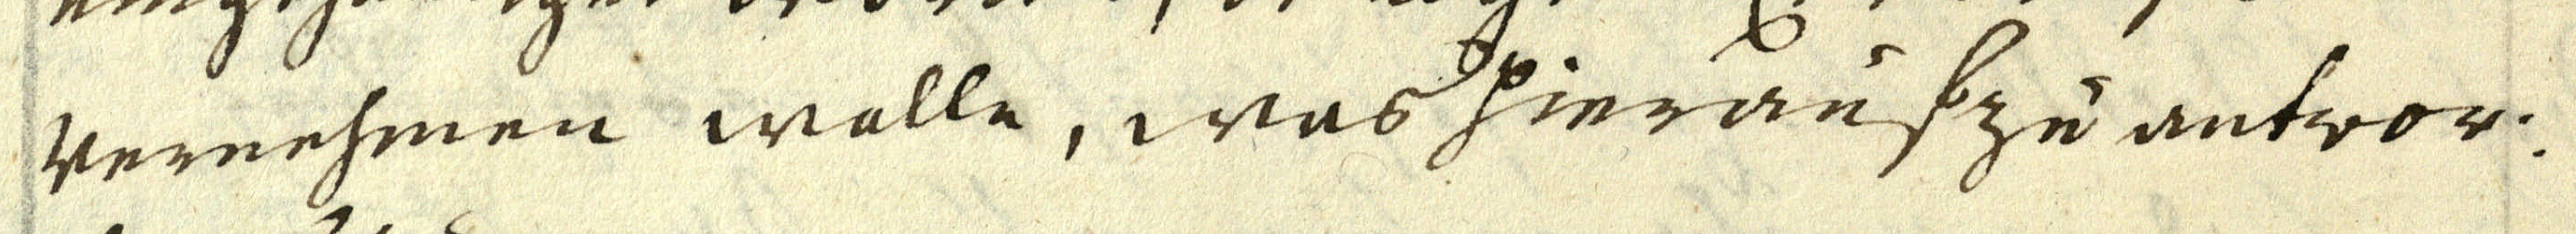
vernehmen wolle, was hierauf zu antwor¬
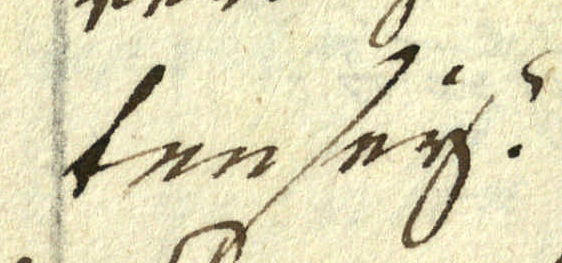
ten seÿ?
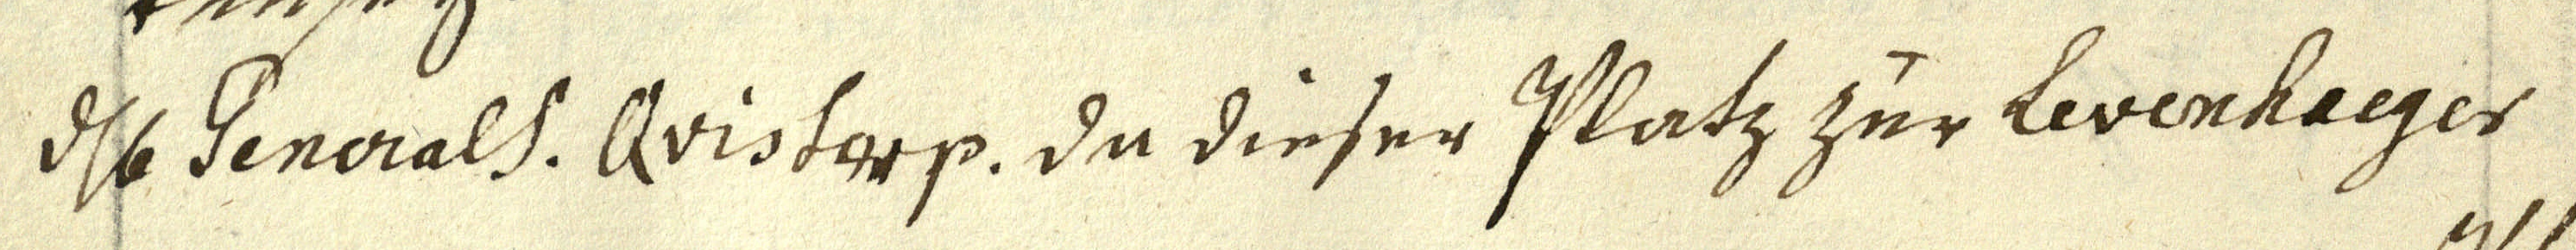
dh GeneralS. Quistorp. Da dieser Platz zur Levenhaeger
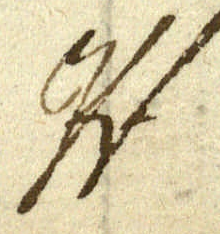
Pf
